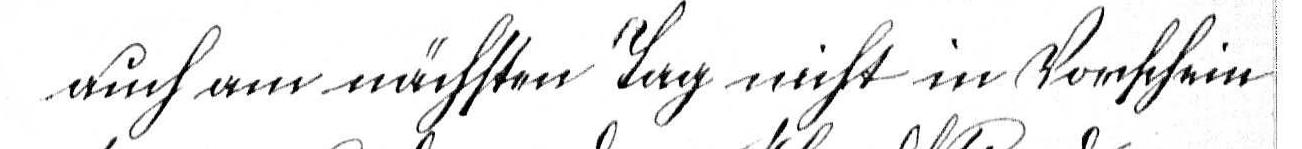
auch am nächsten Tag nicht in Vorschein
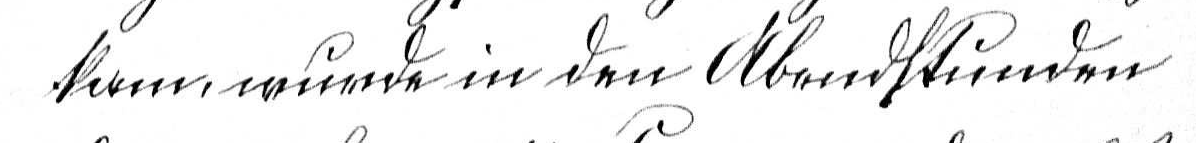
kam, wurde in den Abendstunden
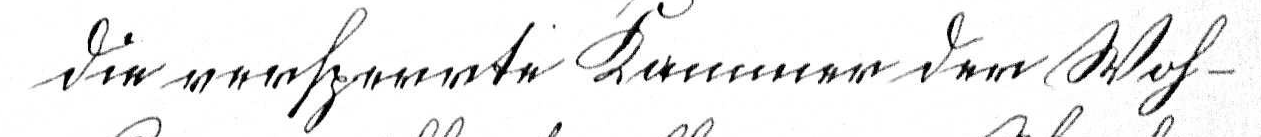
die versperrte Kammer der Woh¬
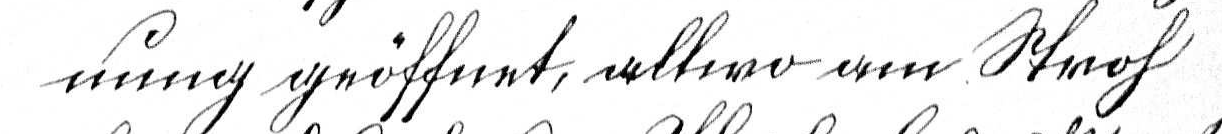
nung geöffnet, allwo am Stroh
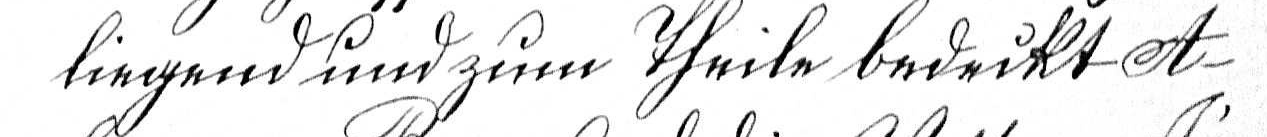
liegend und zum Theile bedeck A¬
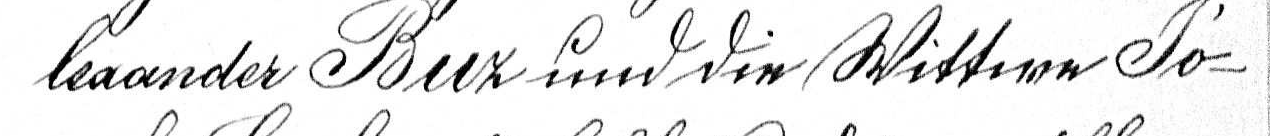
lexander Buz und die Wittwe Jo¬
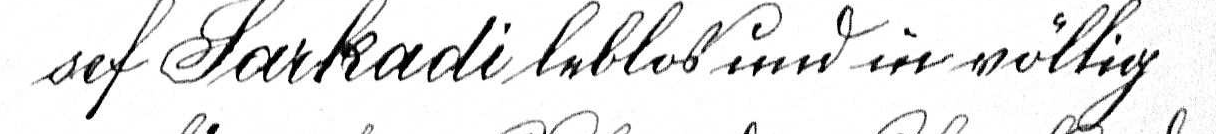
sef Sarkadi leblos und in völlig
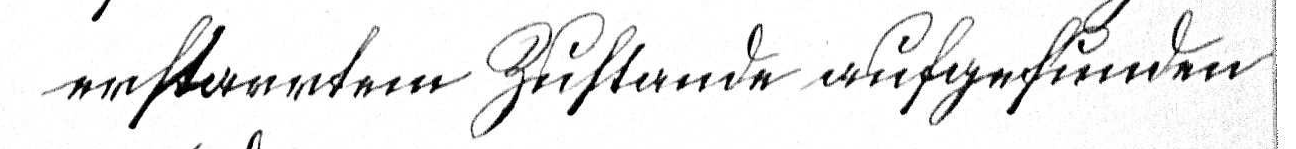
erstarrten Zustande aufgefunden
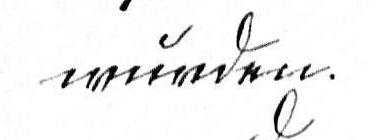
wurden.
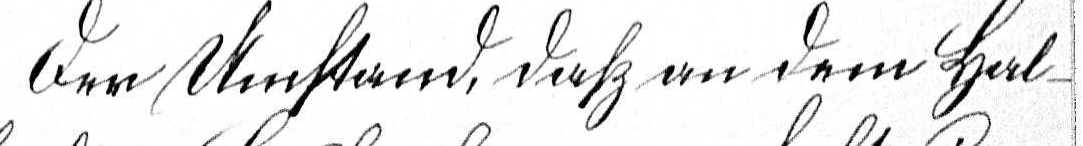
Der Umstand, daß an dem Hal¬
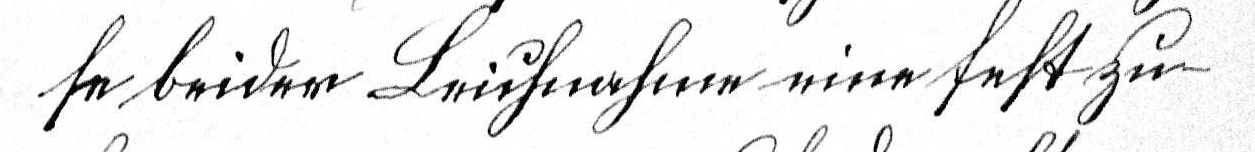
se beider Leichnahme eine fest zu¬
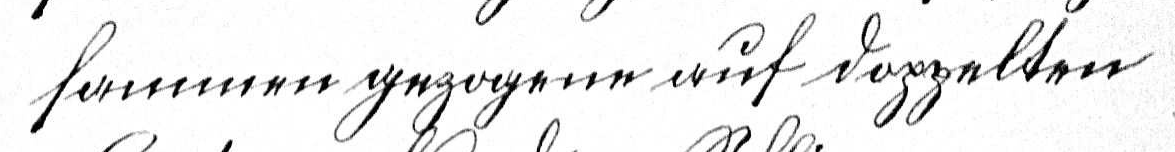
sammen gezogene auf doppelten
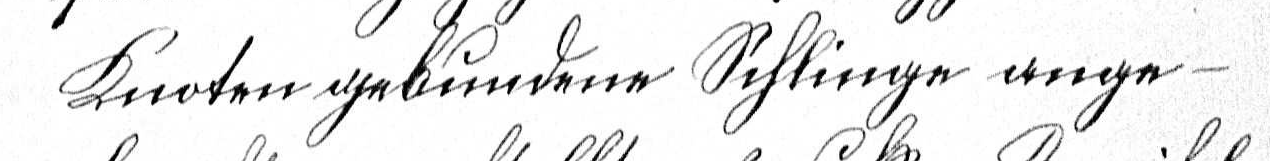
Knoten gebundene Schlinge ange¬
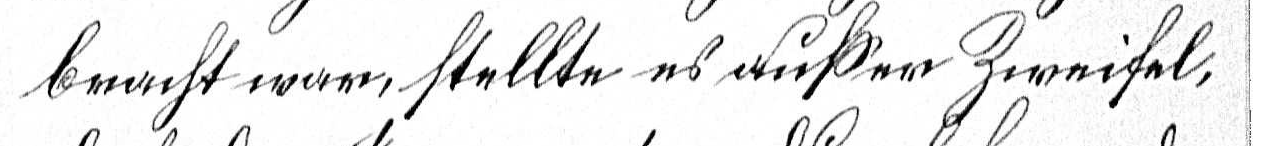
bracht war, stellte es außer Zweifel,
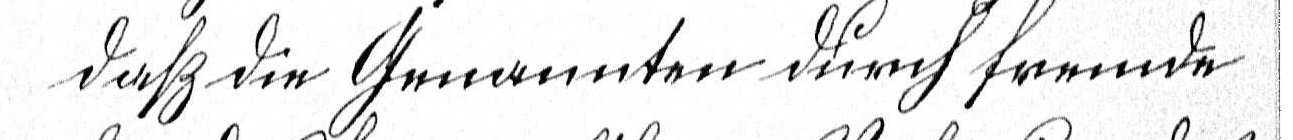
daß die Genannten durch fremde
